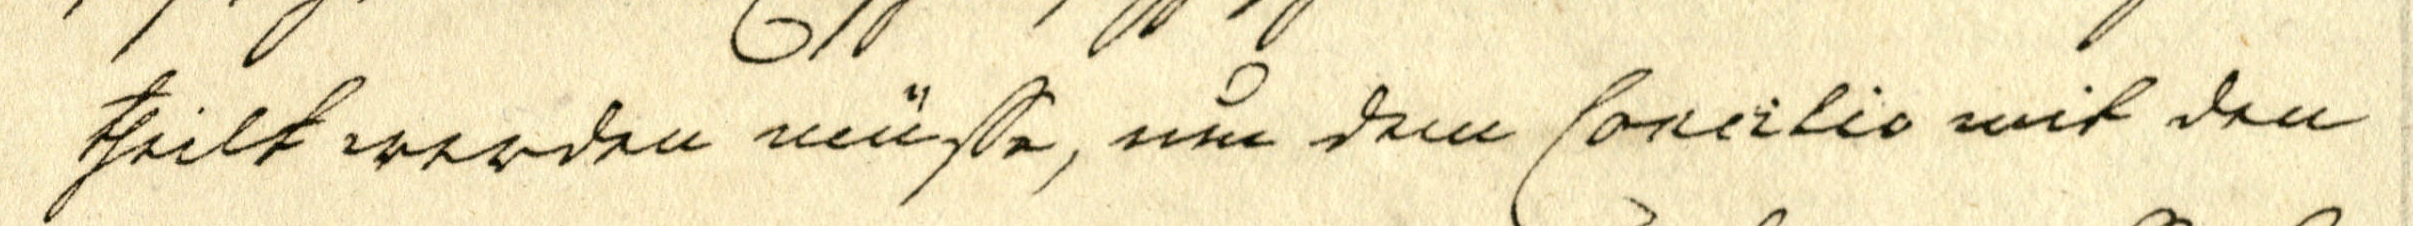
theilt werden müsse, um dem Concilio mit den
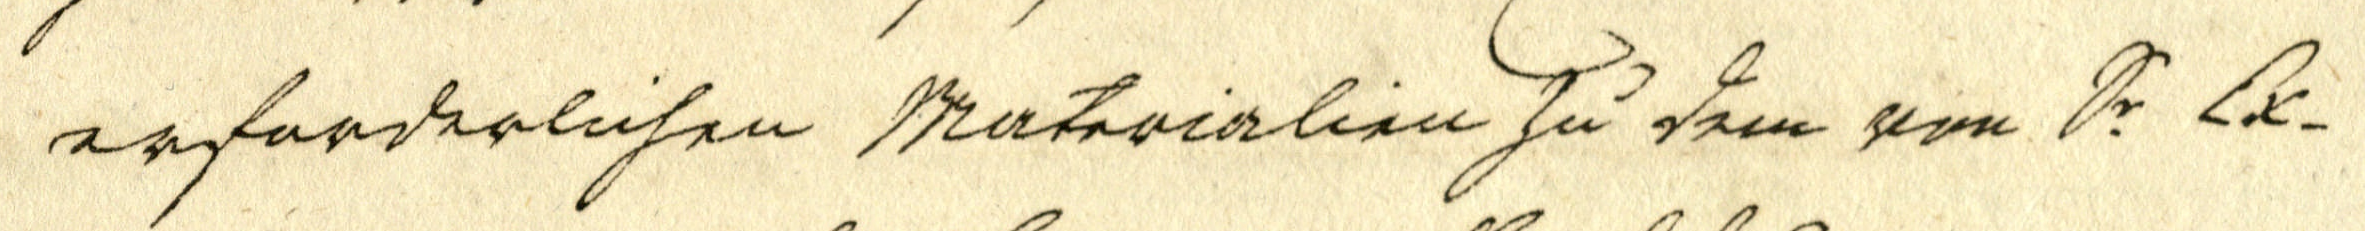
erforderlichen Materialien zu dem von Sr. Ex¬
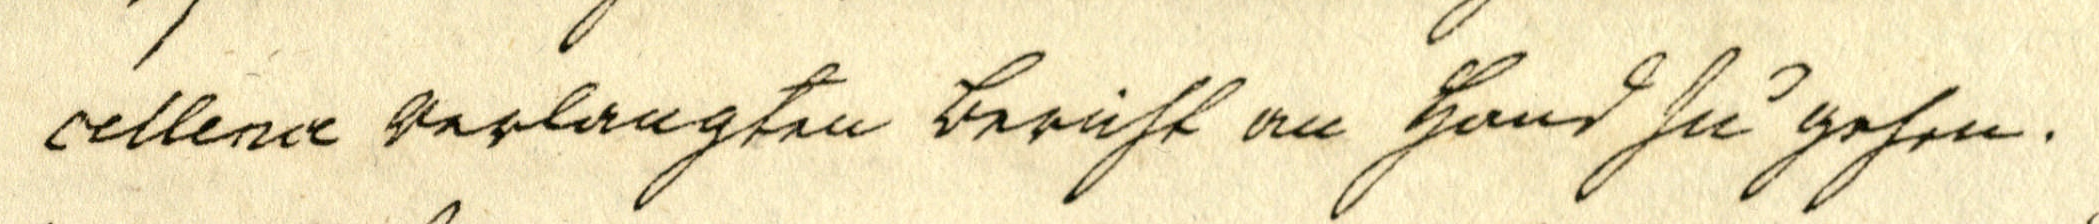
cellence verlangten Bericht an Hand zu gehen.
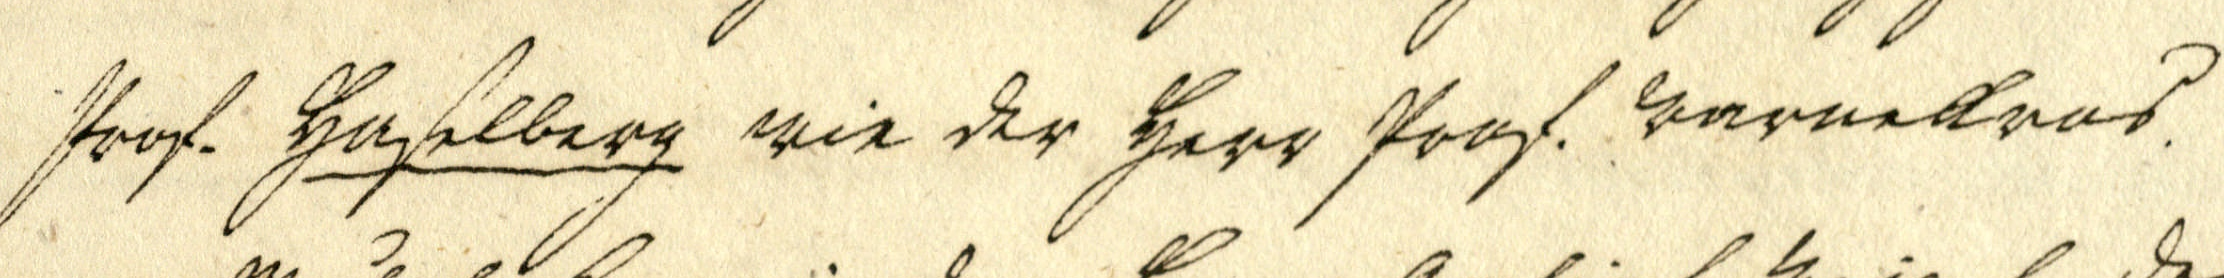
Prof. Haselberg wie der Herr Prof. Warnekros.
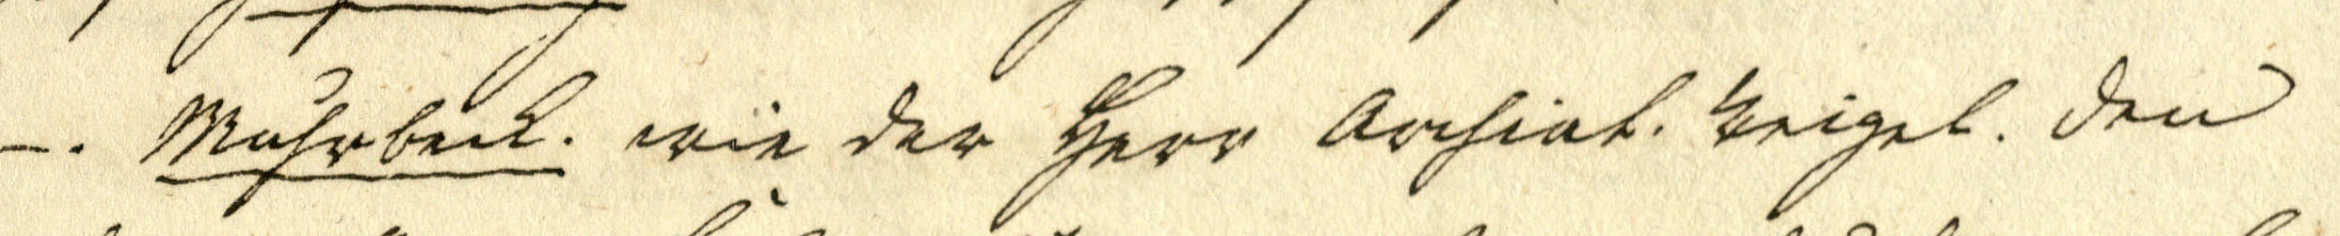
Muhrbeck. wie der Herr Archiat. Weigel. Den
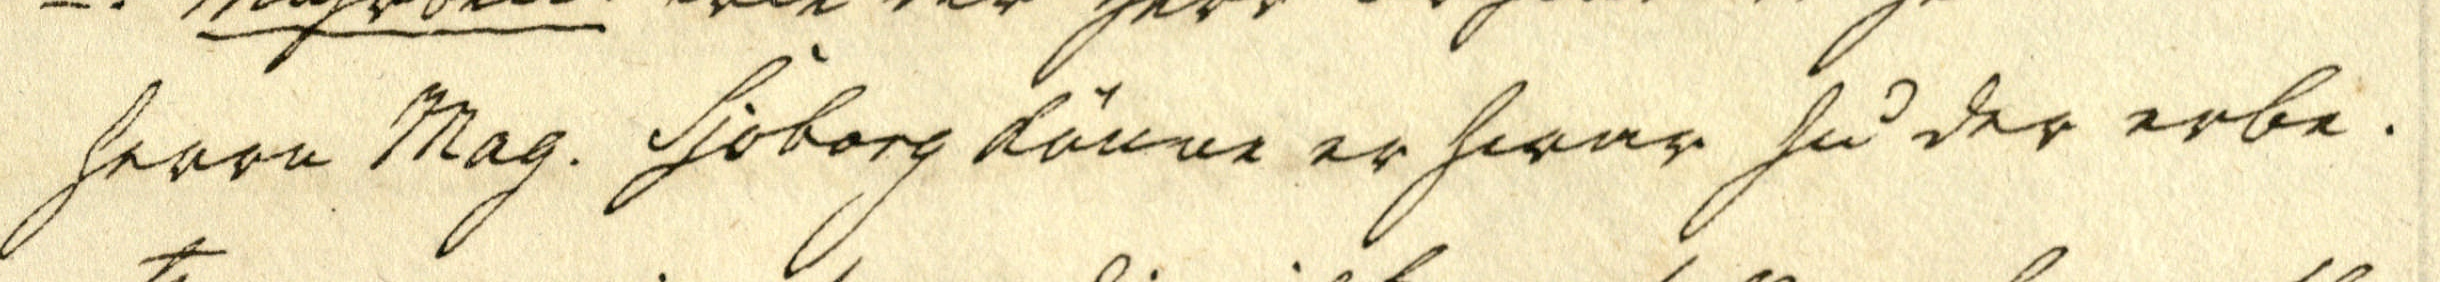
herrn Mag. Sjöborg könne er zwar zu der erbe¬
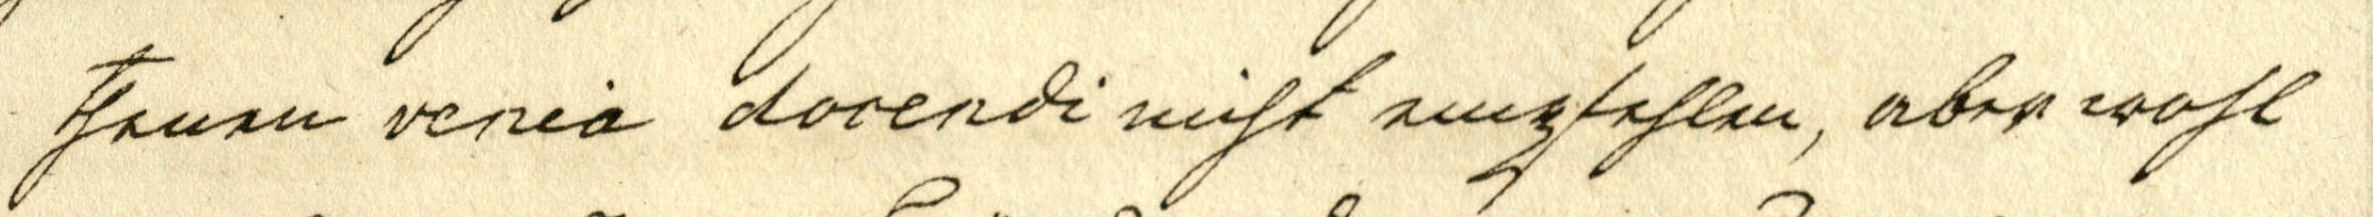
thenen venia docendi nicht empfehlen, aber wohl
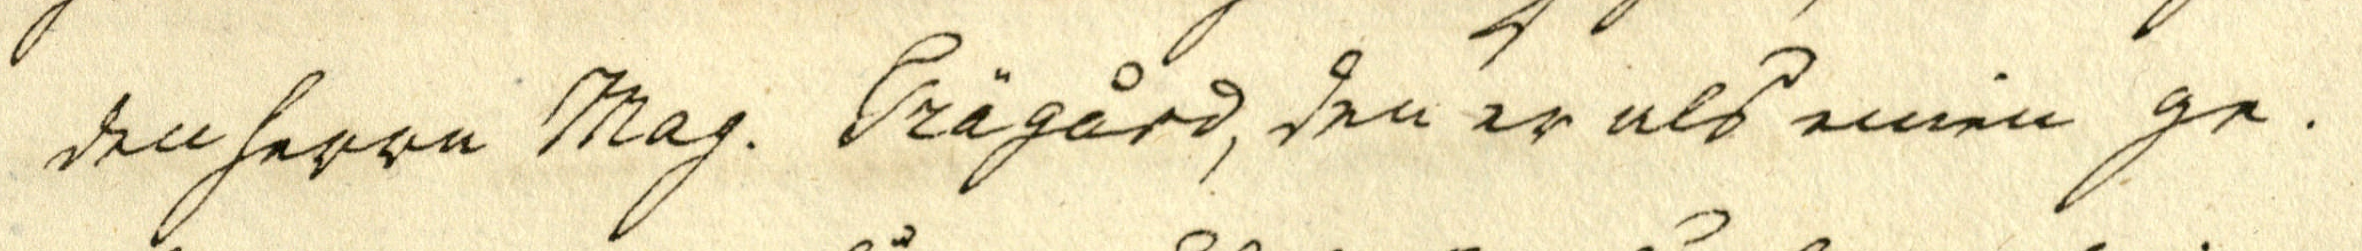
den herrn Mag. Trägård, den er als einen ge¬
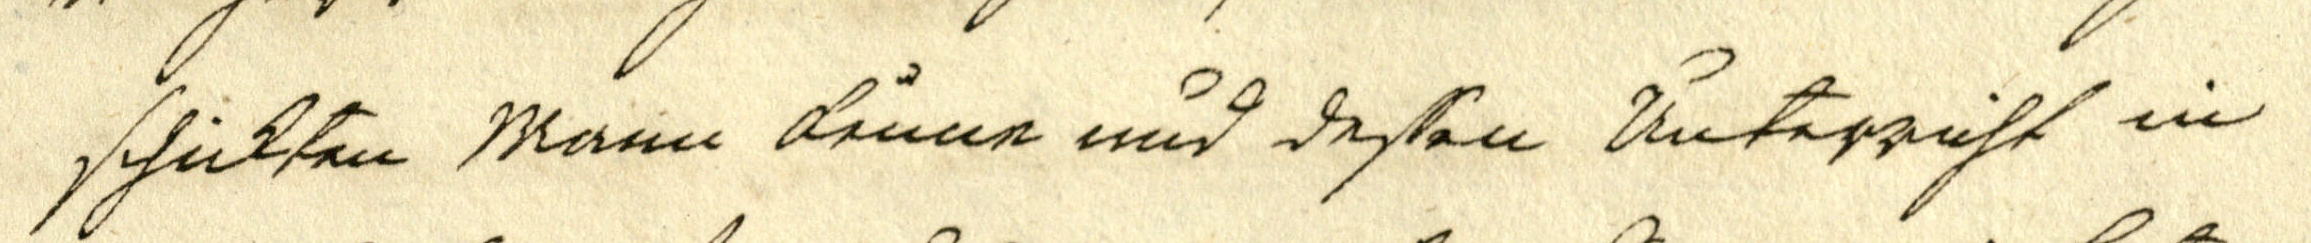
schickten Mann kenne und dessen Unterricht in
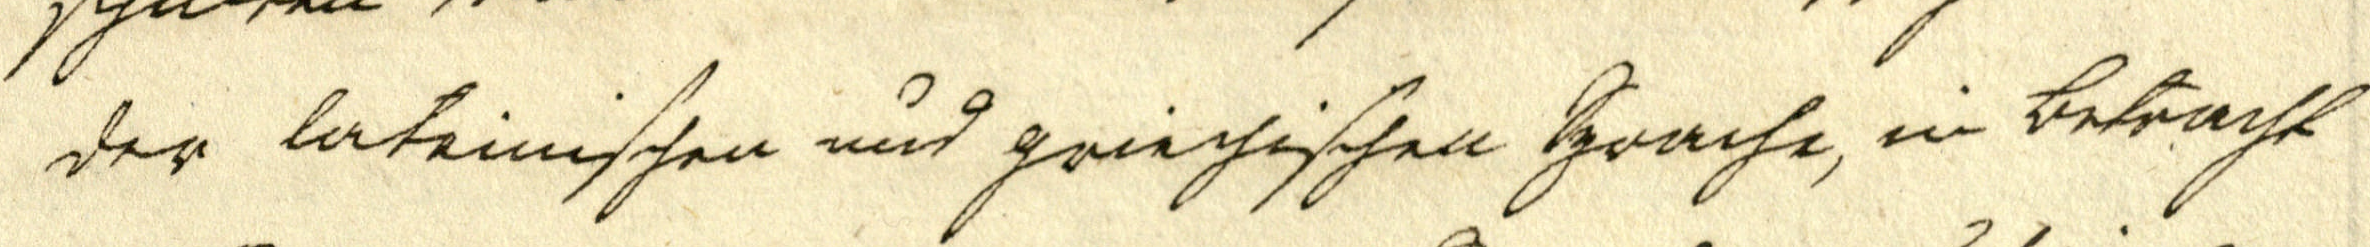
der lateinischen und griechischen Sprache, in Betracht
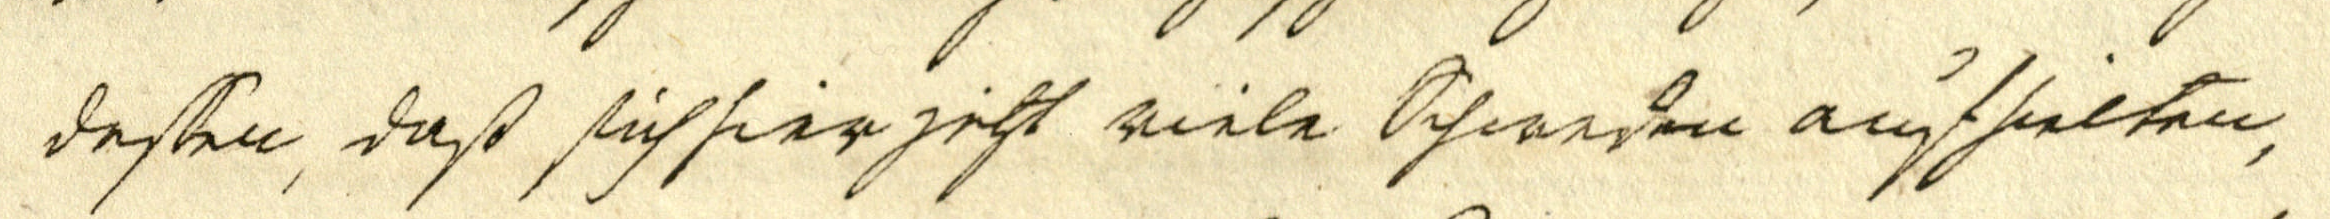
dessen, daß sich hier jetzt viele Schweden aufhielten,
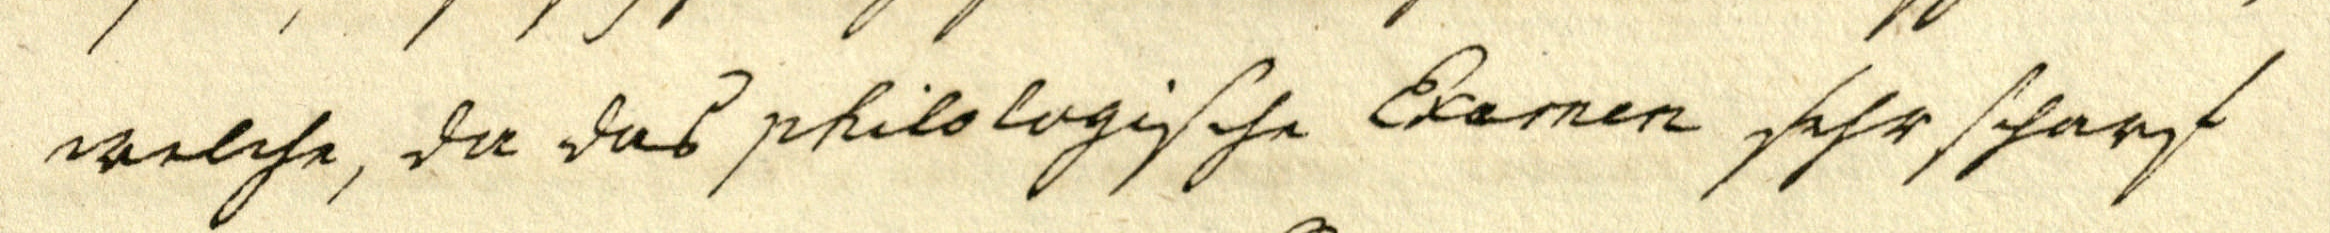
welche, da das philosophische Examen sehr scharf
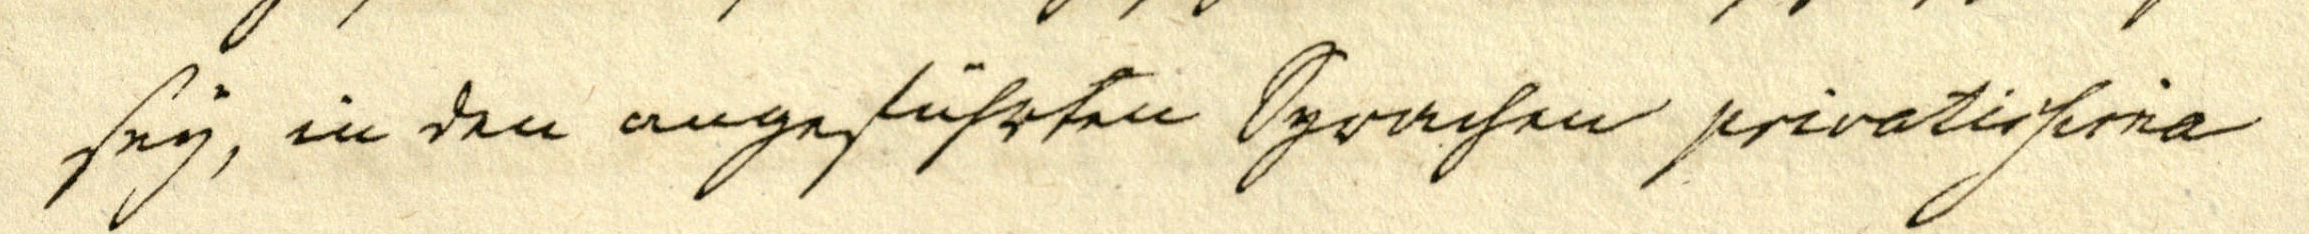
seÿ, in den angeführten Sprachen privatissima
